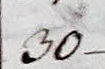30
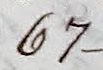67
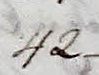42
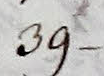39
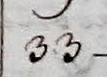33
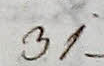31
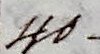40
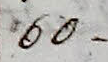60
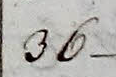36
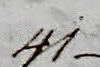41
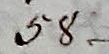58
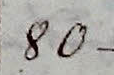80
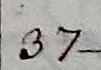37
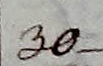30
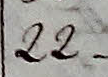22
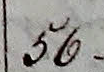56
